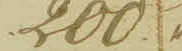200.
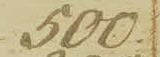500.
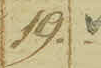19.
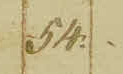54.
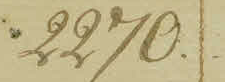2270.
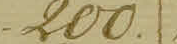200.
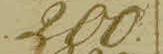200.
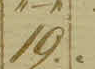19.
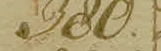380.
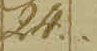24.
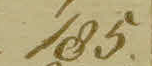185.
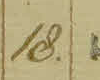18.
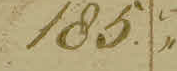185.
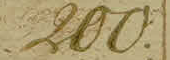200.
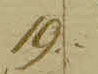19.
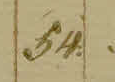54.
